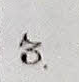3.
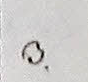3.
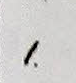1.
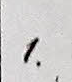1.
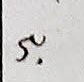5.
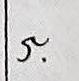5.
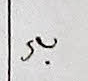5.
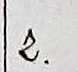2.
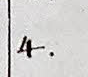4.
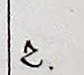2.
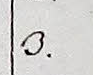3.
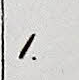1.
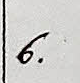6.
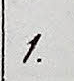1.
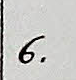6.
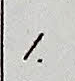1.
